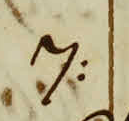7:
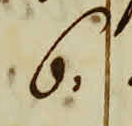6:
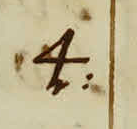4:
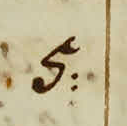5:
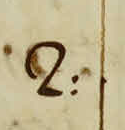2:
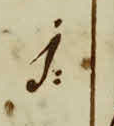1:
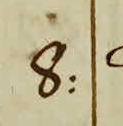8:
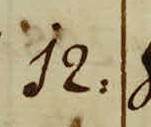12:
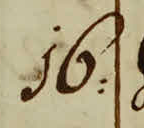16:
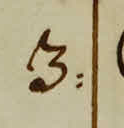3:
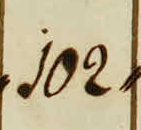102
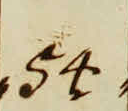54
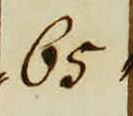65
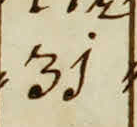31
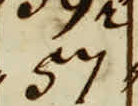57
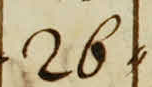26
